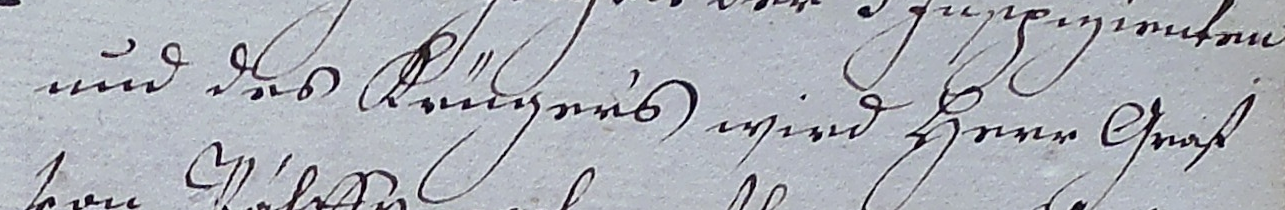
und des Krügers wird Herr Graf
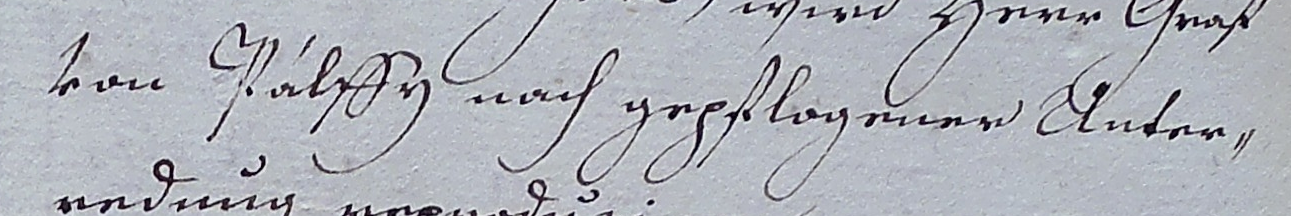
von Pálffy nach gepflogener Unter¬
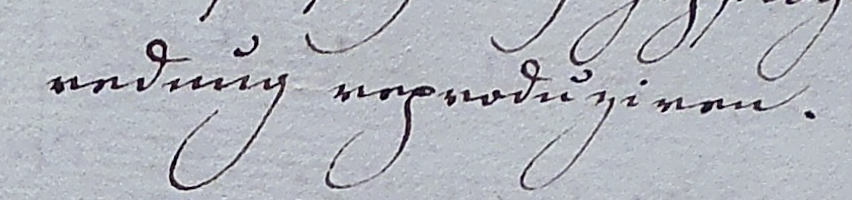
redung reproduziren.
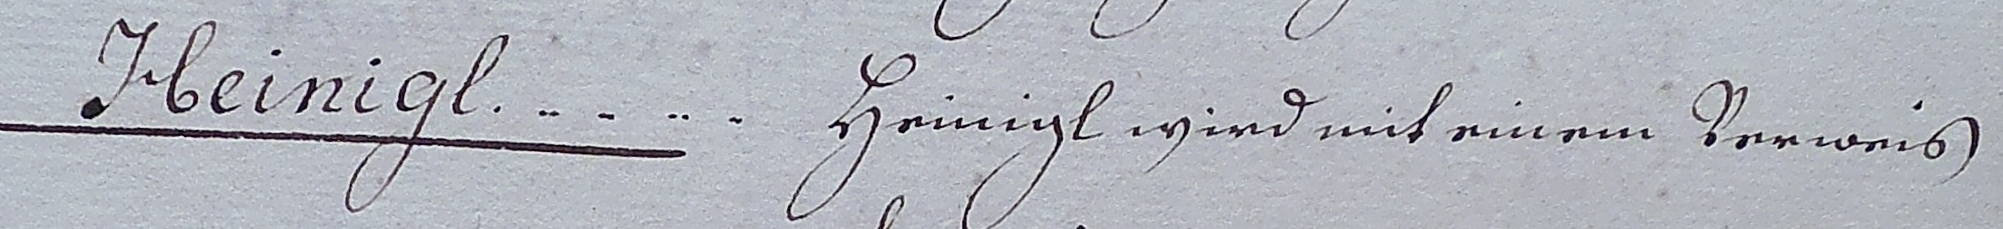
Heinigl. .. .. .. .. Heinigl wird mit einem Verweis
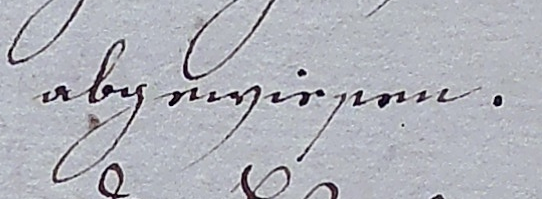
abgewiesen.
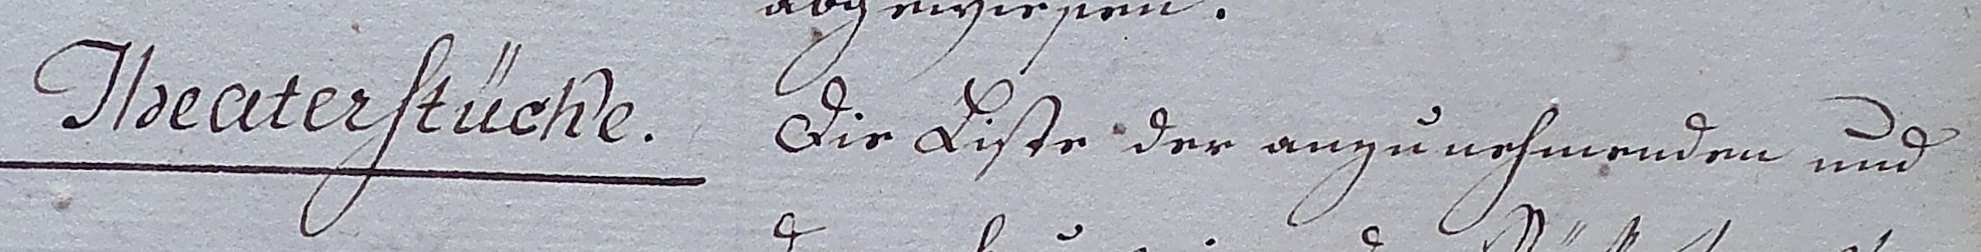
Theaterstücke. Die Liste der anzunehmenden und
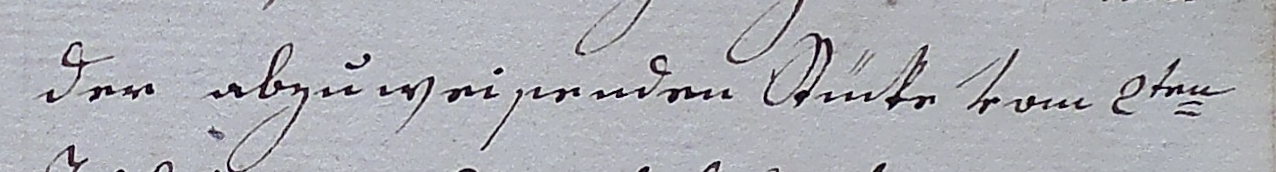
der abzuweisenden Stücke vom 2te͇n
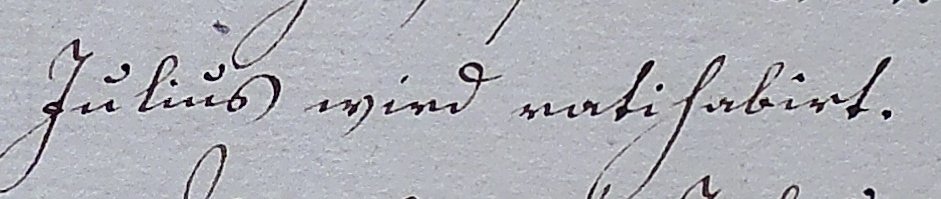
Julius wird ratihabirt.
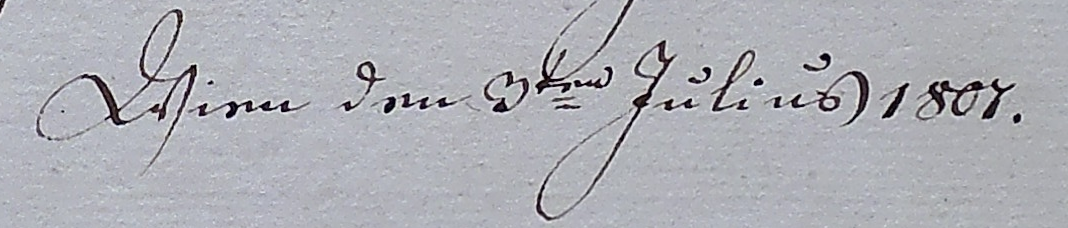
Wien den 3te͇n Julius 1807.
